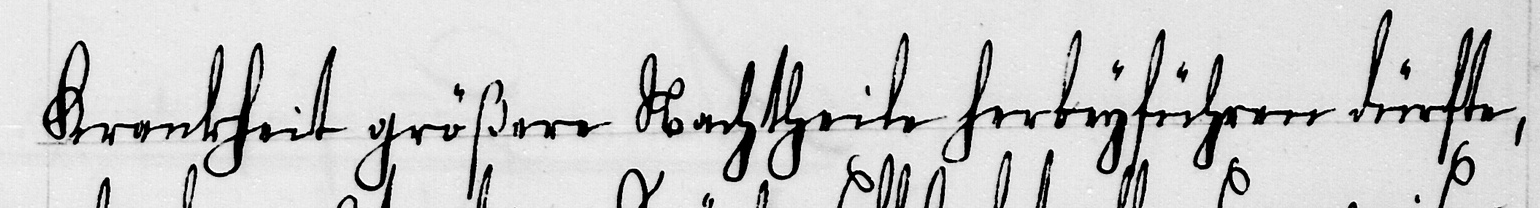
Krankheit größere Nachtheile herbeyführen dürfte,
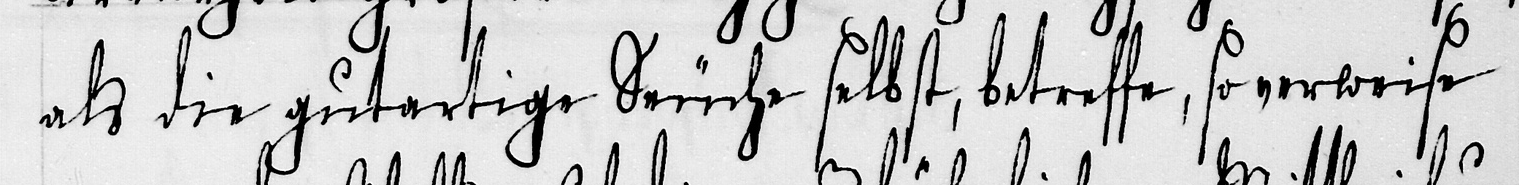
als die gutartige Seuche selbst, betreffe, so verweise
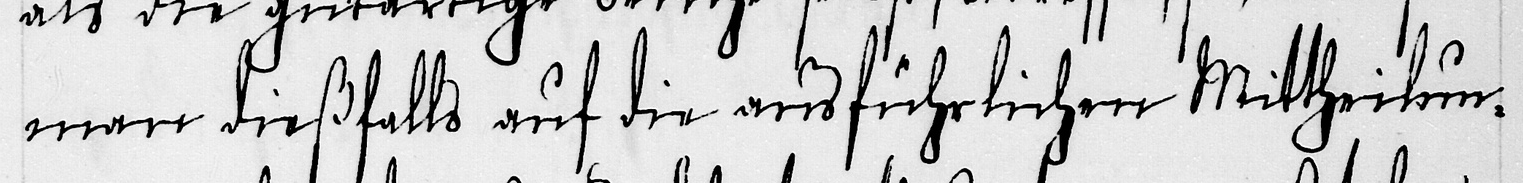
man dießfalls auf die ausführlichen Mittheilun¬
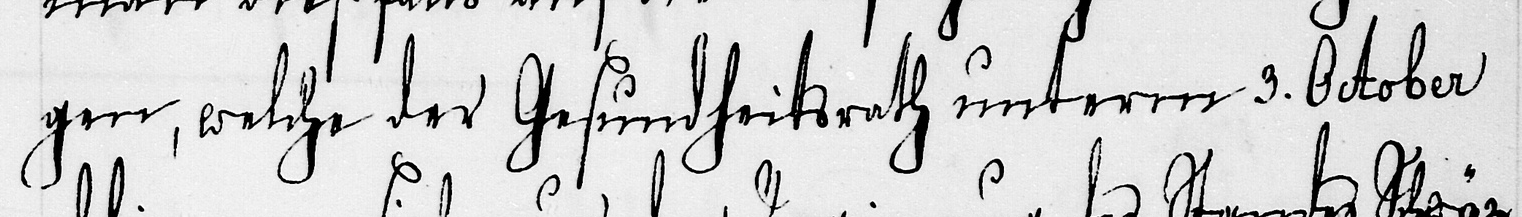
gen, welche der Gesundheitsrath unterm 3. October
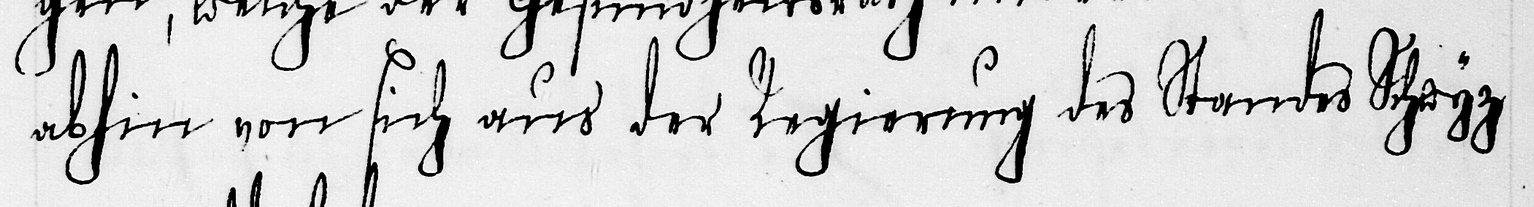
abhin von sich aus der Regierung des Standes Schwyz
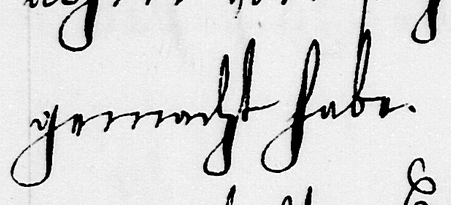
gemacht habe.
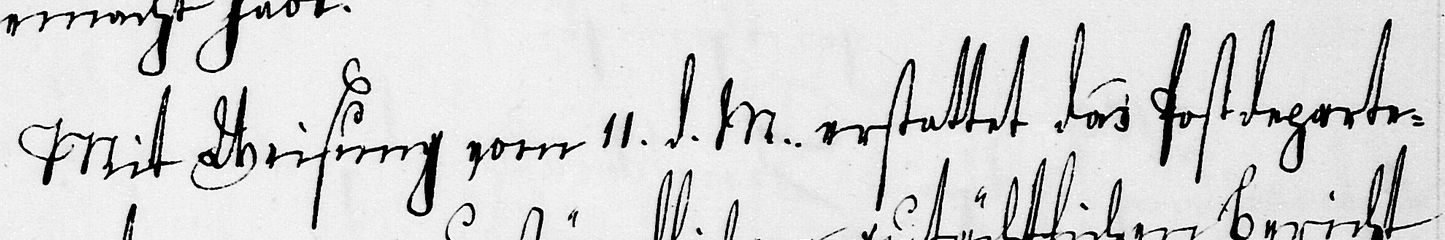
Mit Weisung vom 11. d. M. erstattet das Postdepart¬
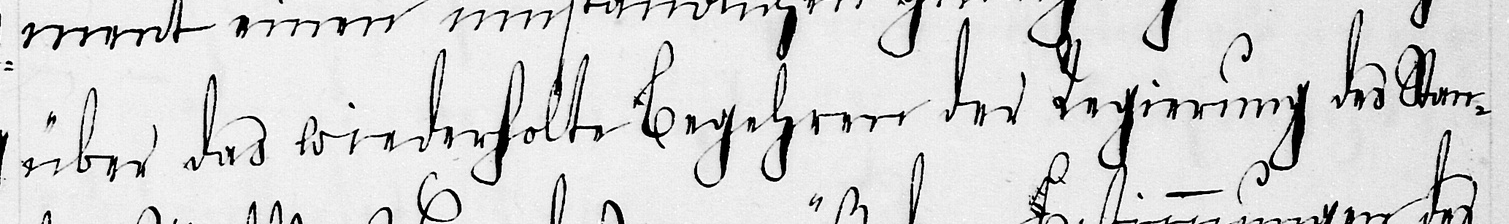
über das wiederholte Begehren der Regierung des Stan¬
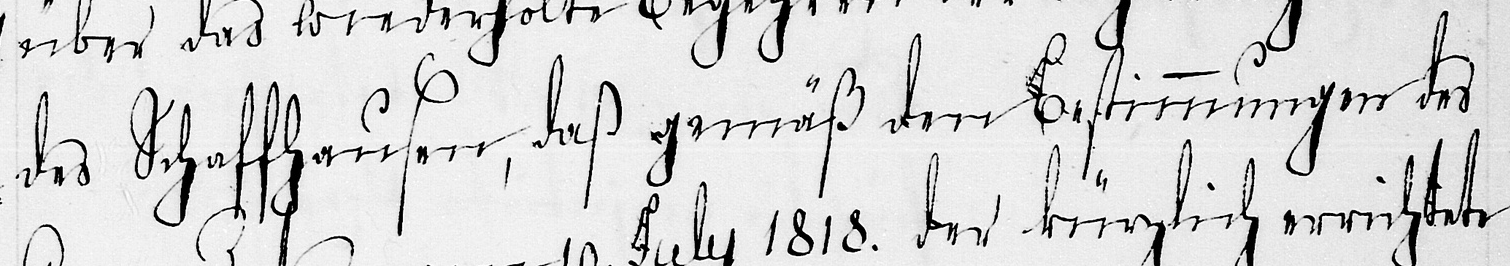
des Schaffhausen, daß gemäß den Bestimmungen des
